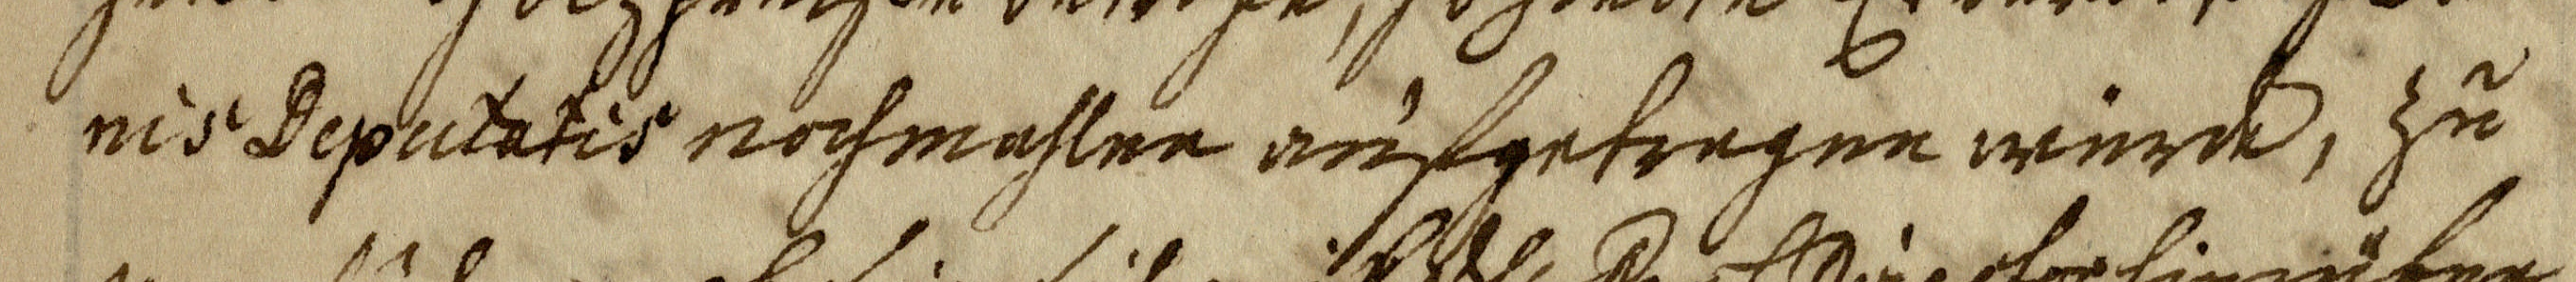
nis Deputatis nochmahlen aufgetragen würde, zu
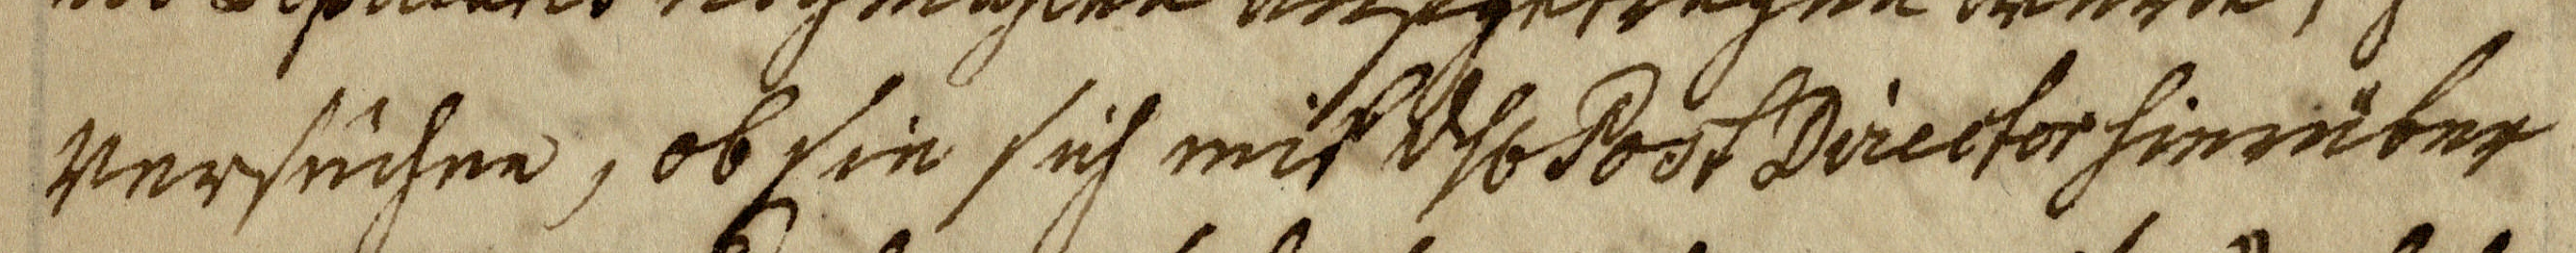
versuchen, ob sie sich mit dh PostDirector hierüber
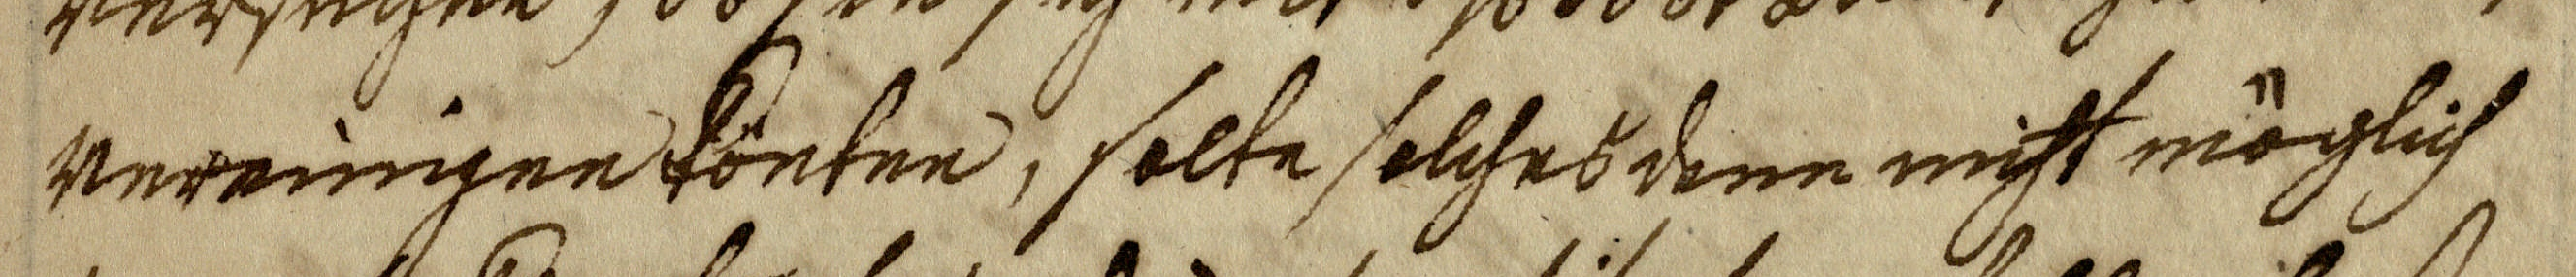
vereinigen könten, solte solches denn nicht möglich
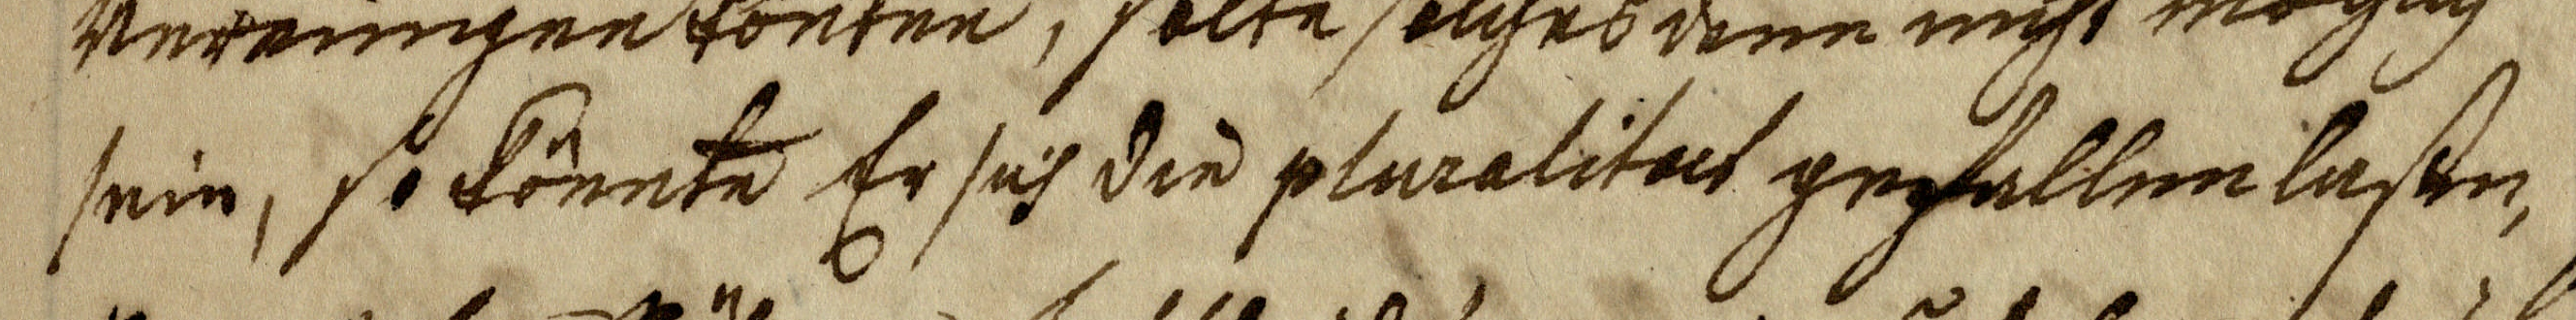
sein, so könnte Er sich die pluralitaet gefallen laßen,
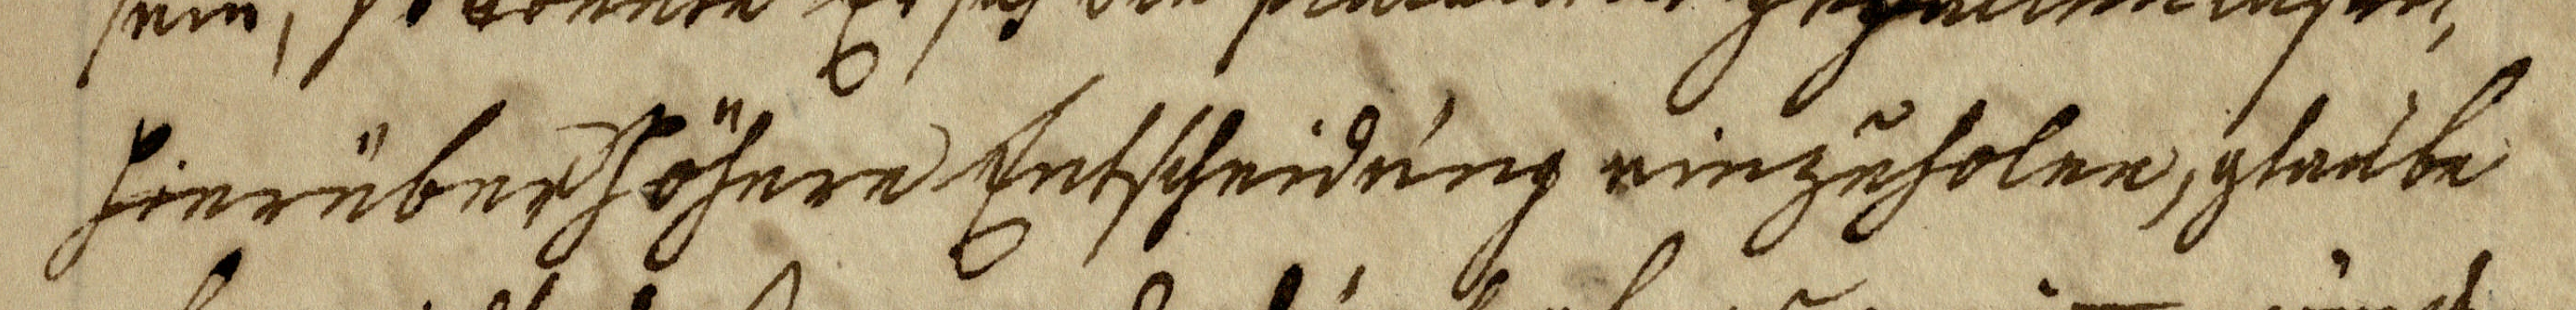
hierüber höhere Entscheidung einzuholen, glaube
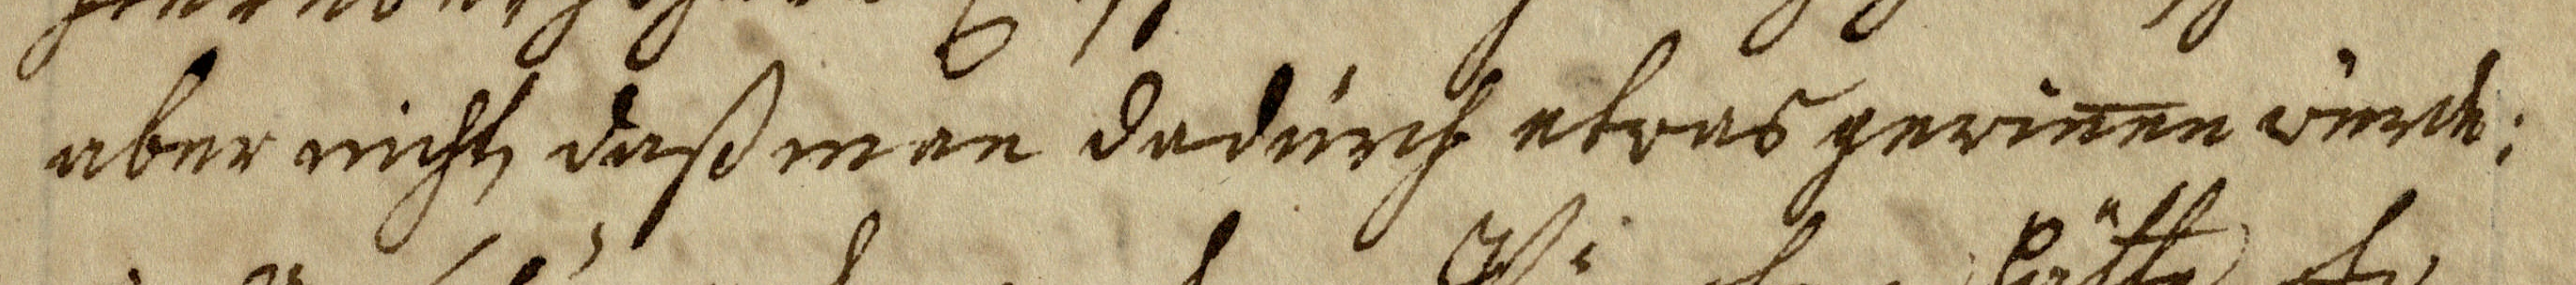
aber nicht, daß man dadurch etwas gewinen würde,
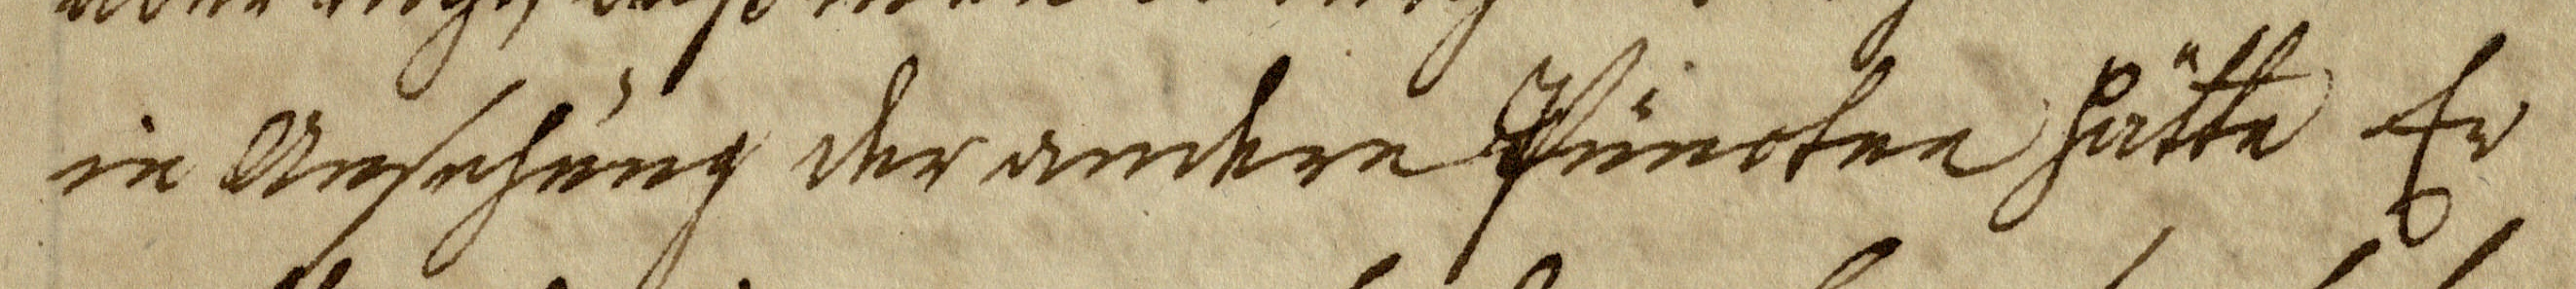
in Ansehung der andern Puncten hätte Er
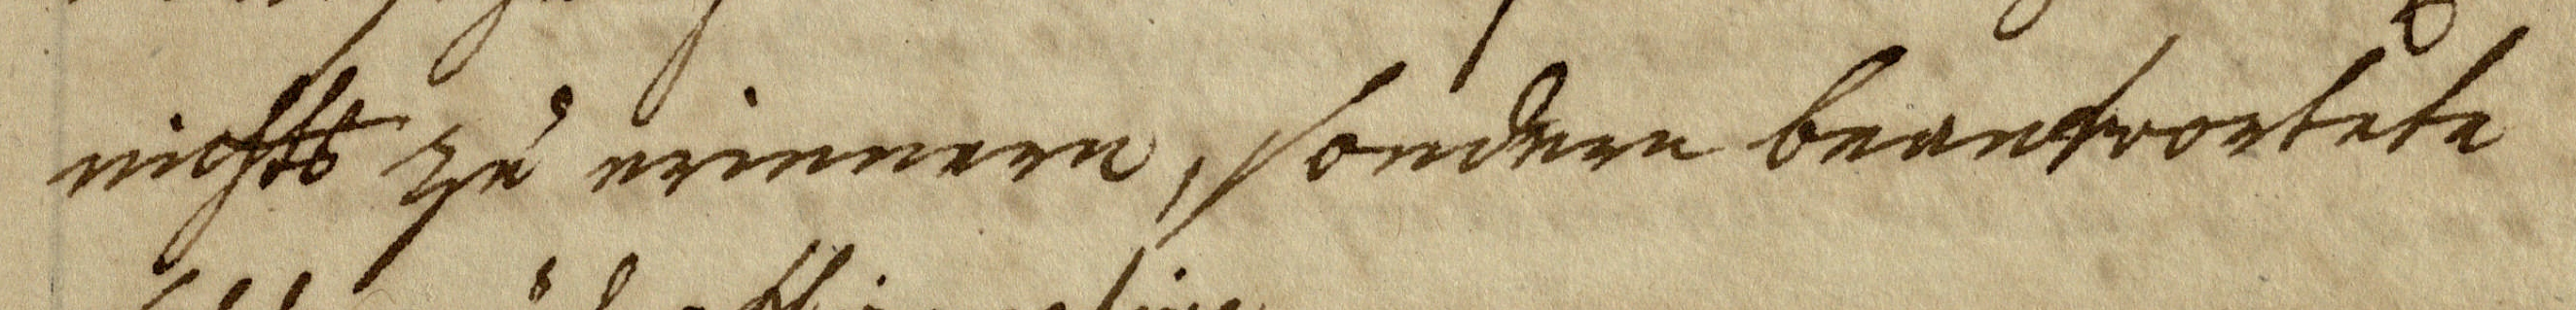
nichts zu erinnern, sondern beantwortete
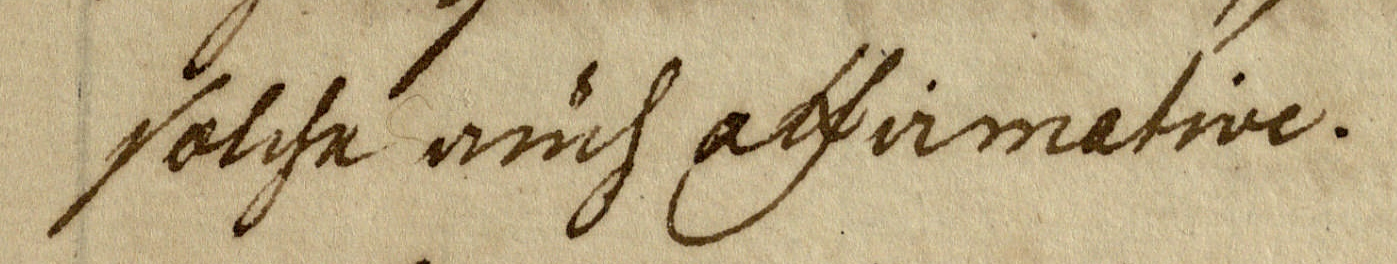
solche auch affirmative.
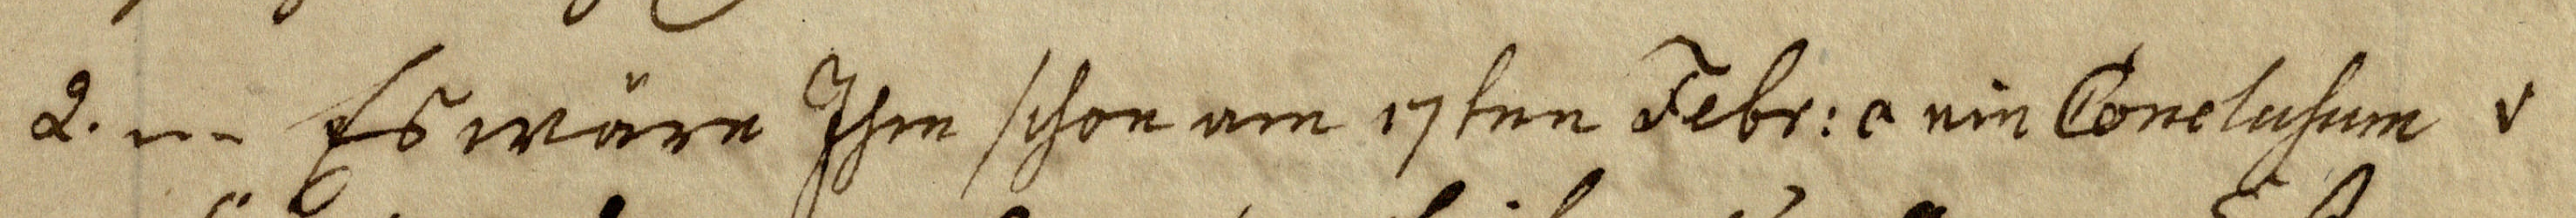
2. Es wäre Ihm schon am 17ten Febr. c ein Conclusum
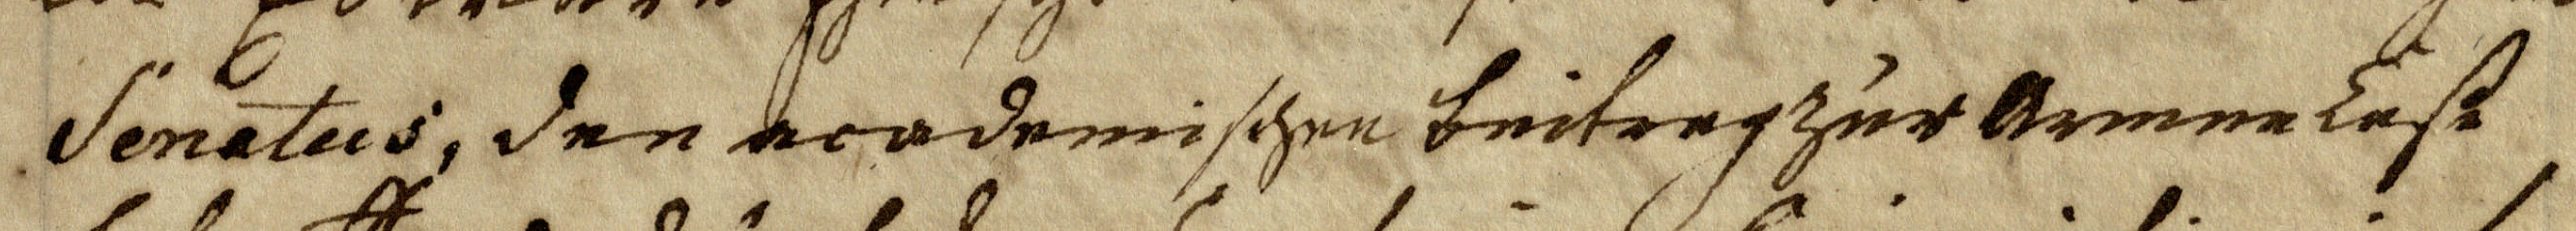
Senatus, den academischen Beitrag zur Armen Kaße
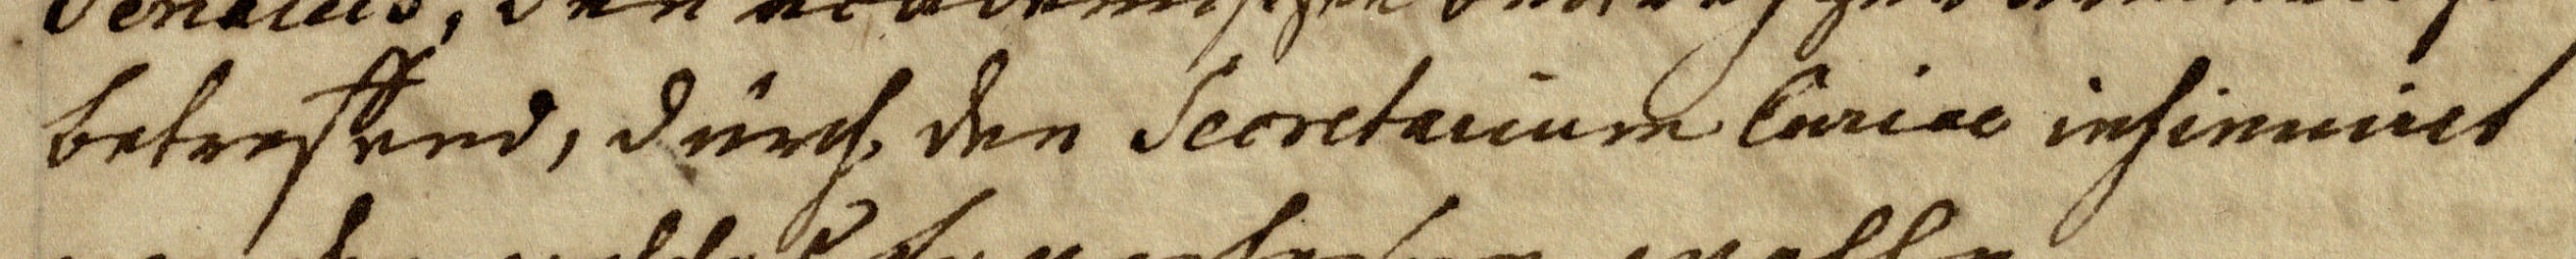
betreffend, durch den Secretarium Curiae insinuiret
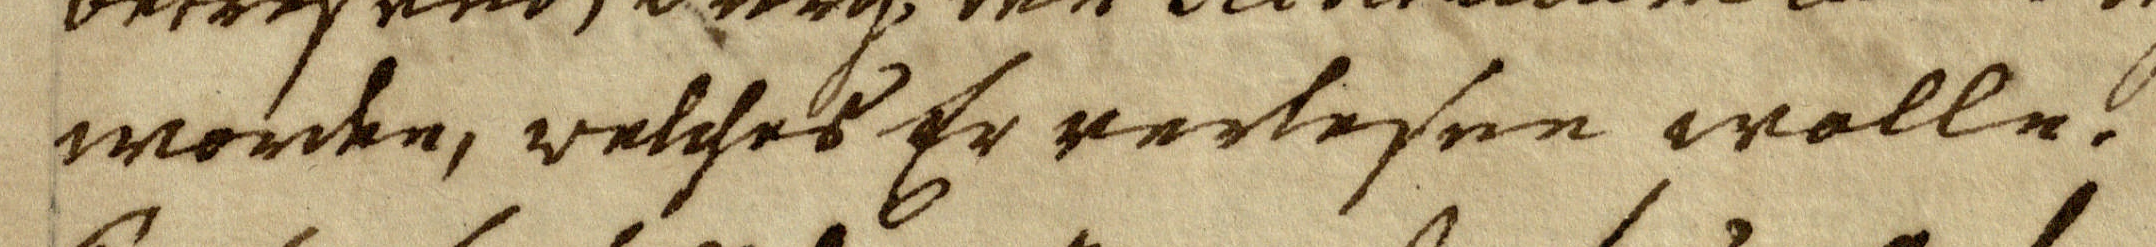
worden, welches Er verlesen wolle.
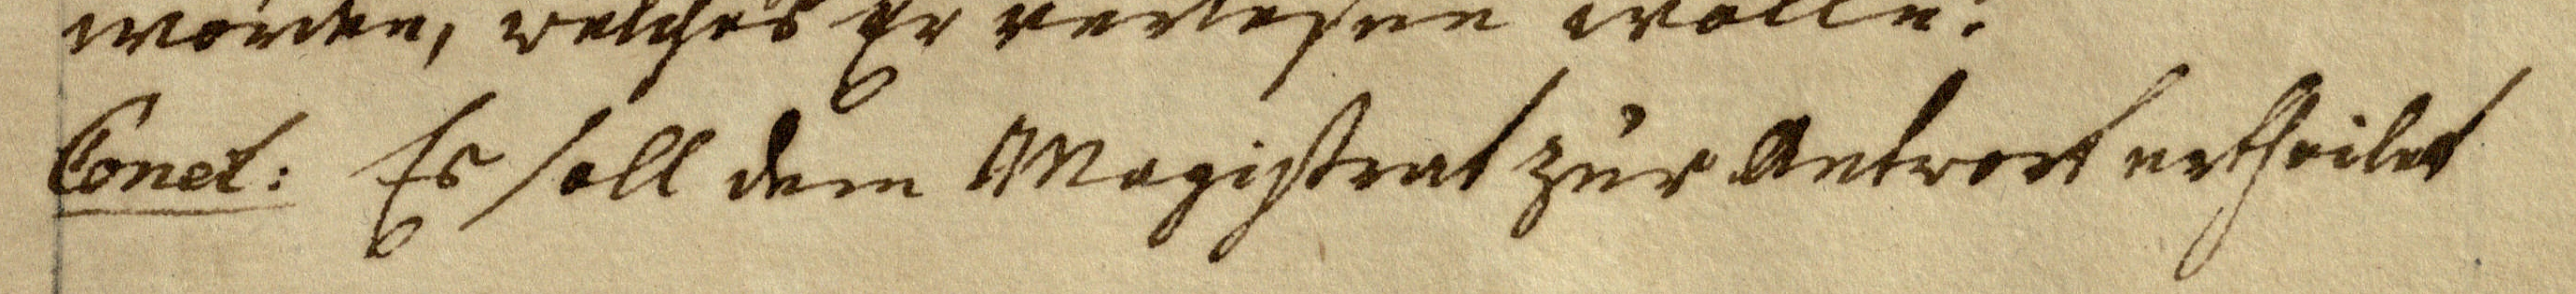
Concl. Es soll dem Magistrat zur Antwort ertheilet
